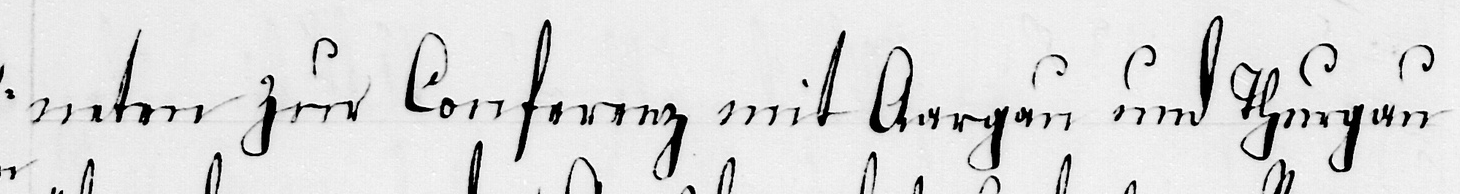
neten zur Conferenz mit Aargau und Thurgau
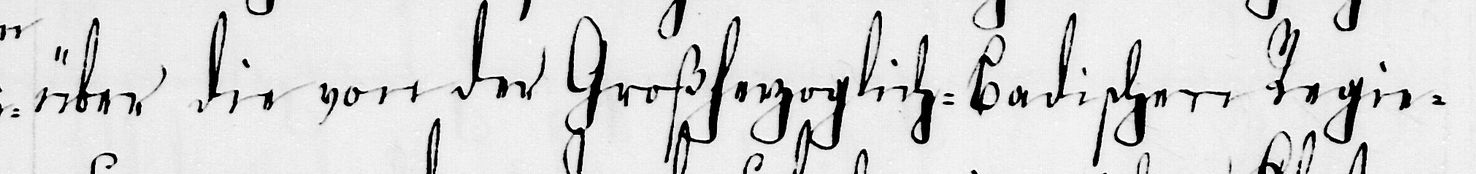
über die von der Großherzoglich-Badischen Regie¬
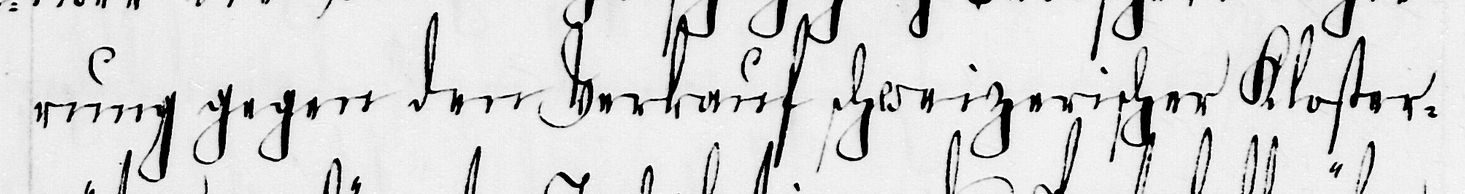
rung gegen den Verkauf schweizerischer Kloster¬
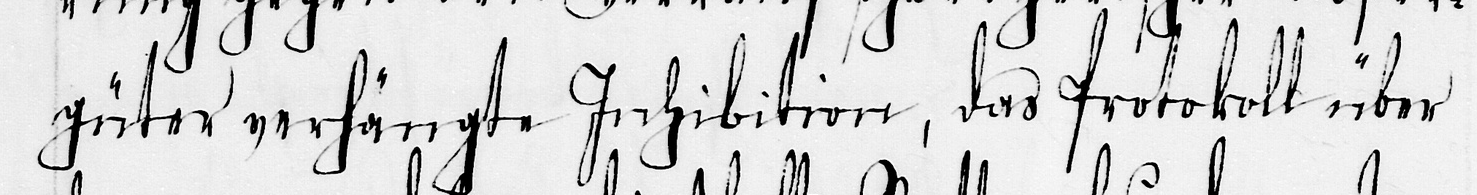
güter verhängte Inhibition, das Protokoll über
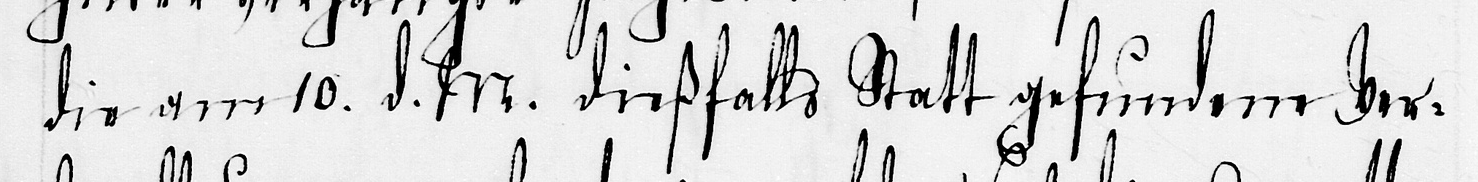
die am 10 d. M. dießfalls Statt gefundene Ver¬
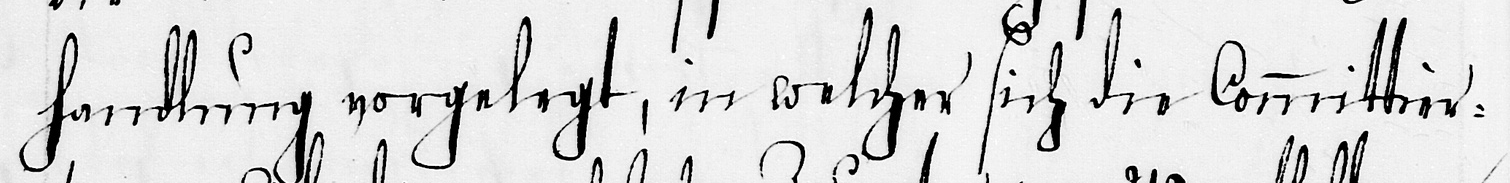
handlung vorgelegt, in welcher sich die Committier¬
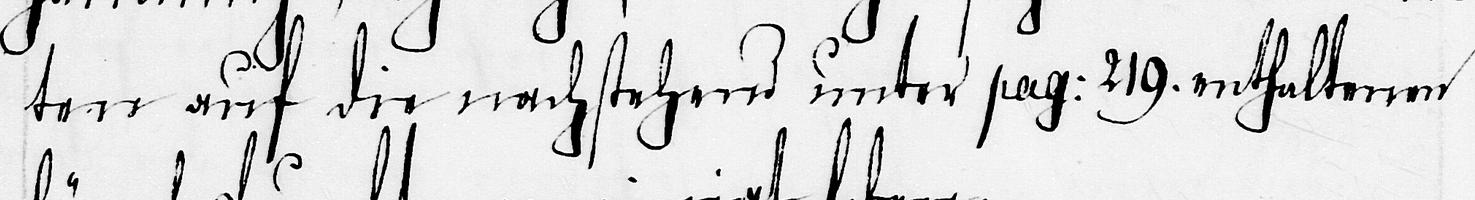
ten auf die nachstehend unter pag: 219. enthaltenen
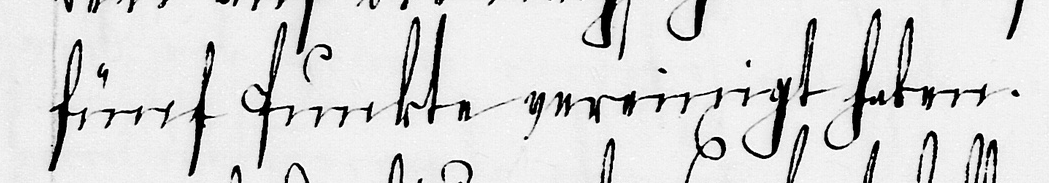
fünf Punkte vereinigt haben.
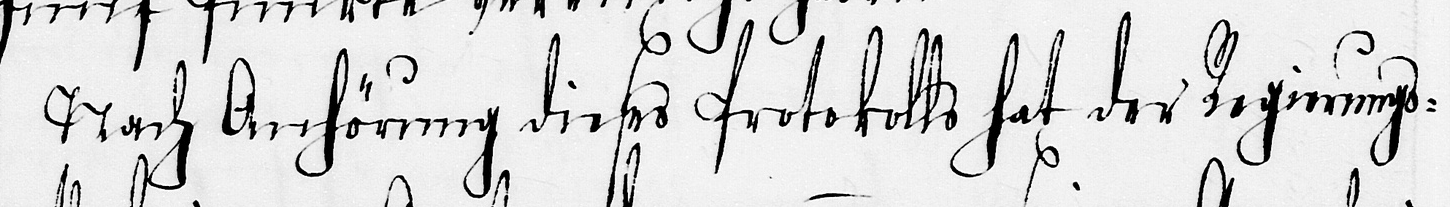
Nach Anhörung dieses Protokolls hat der Regierung¬
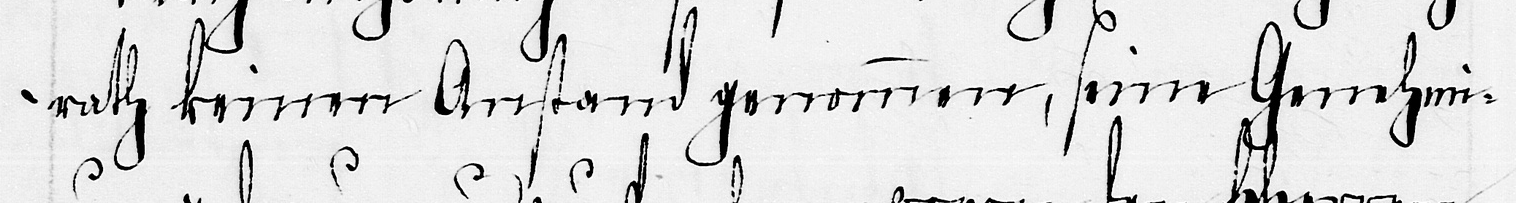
srath keinen Anstand genommen, seine Genehmi¬
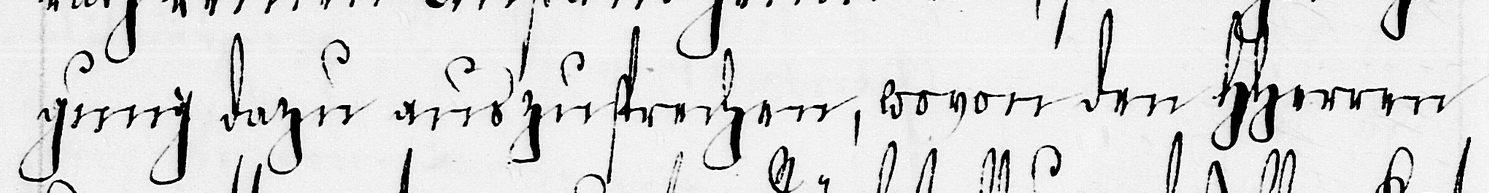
gung dazu auszusprechen, wovon den HHerren
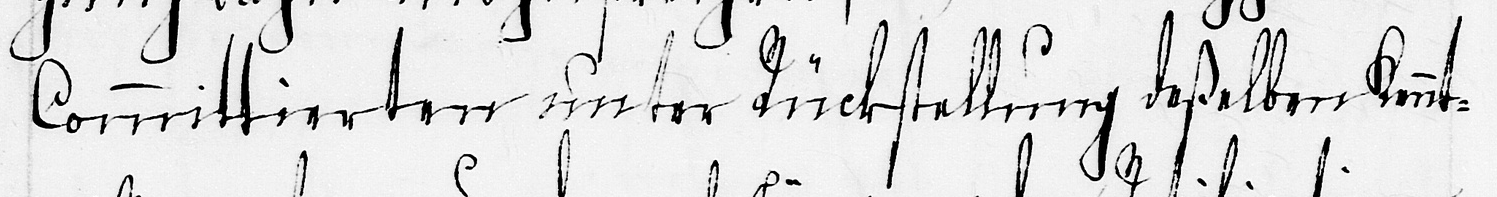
Committierten unter Rückstellung deßelben Ken¬
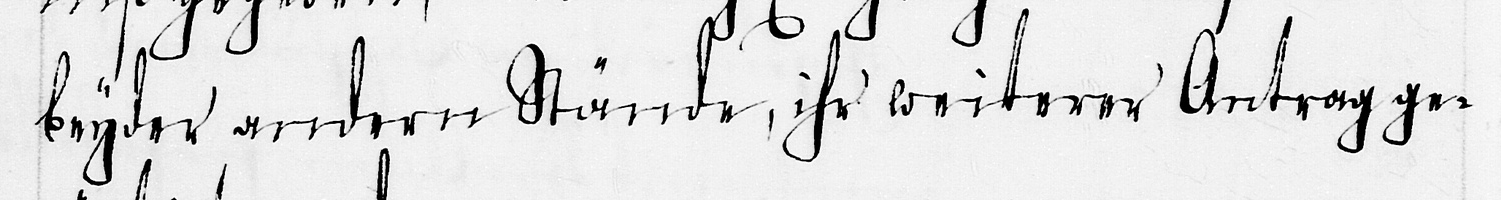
beyder andern Stände, ihr weiterer Antrag ge¬
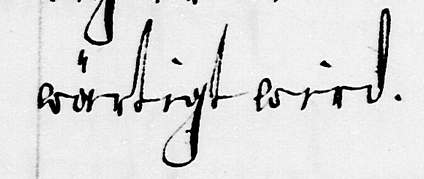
wärtigt wird.
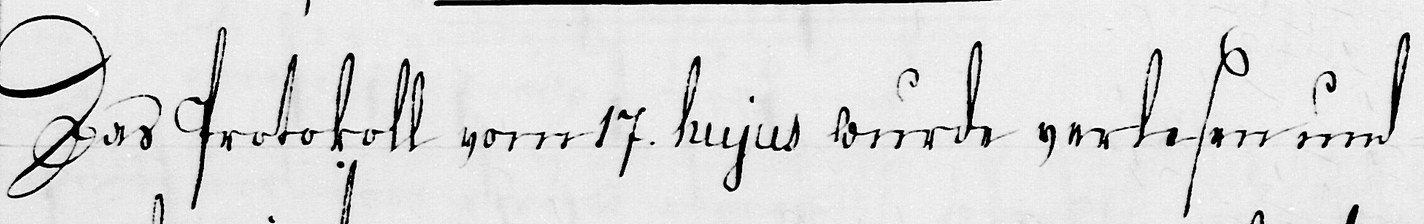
Das Protokoll vom 17. hujus wurde verlesen und
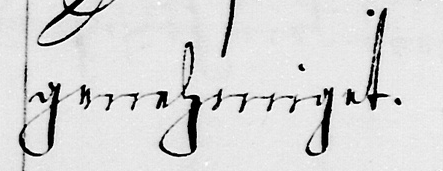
genehmiget.
